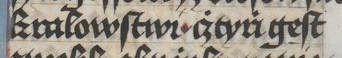kralowſtvwi.ċtyṙi gest
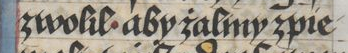zwolil.aby żalmy zpie¬
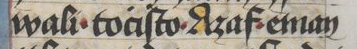wali.toċiſto.Azaf.eman
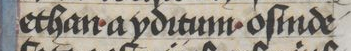ethan a yditum.oſsmde¬
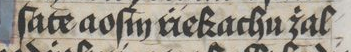ſate a oſm ṙíekachu żal¬
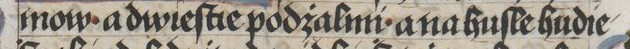mow.a dwieſtie podżalmí.a na huſle hudie¬
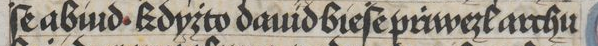ẛe abíud.kdyżto david bíeẛe pṙiwezl archu
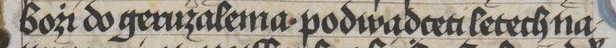bożí do geruzalema.podwadceti letech na¬
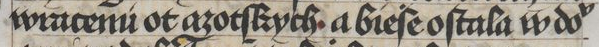wracenú ot azotſkych.a bieẛe oſtala w dov
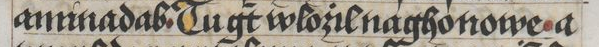aminadab.Tu ḡt wložil naghonowe..a
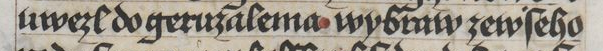uwezl do geruzalema.wybraw zewẛeho
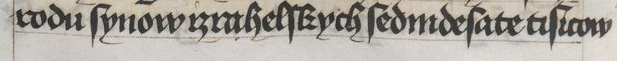rodu ſynow izrahelſkych ſedmdeſate tiſicow
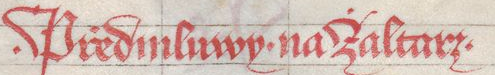.Pṙedmluwy.na Żaltarz.
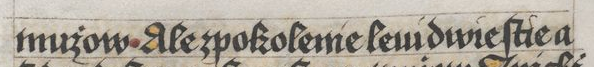mużow.Ale zpokolenie levi dwieſtie a
